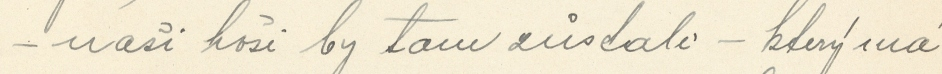- naši hoši by tam zůstali - který má
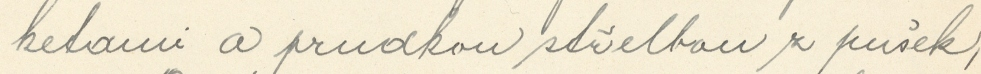ketami a prudkou střelbou z pušek,
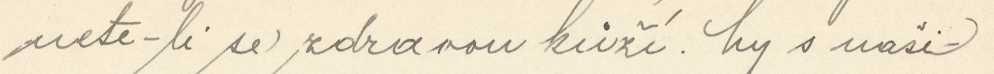nete-li se zdravou kůží. My s naši-
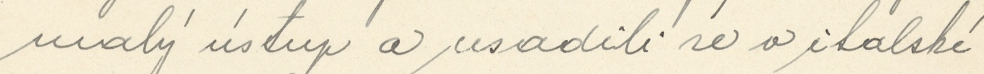malý ústup a usadili se v italské
